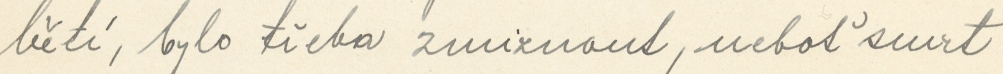bětí, bylo třeba zmiznout, neboť smrt
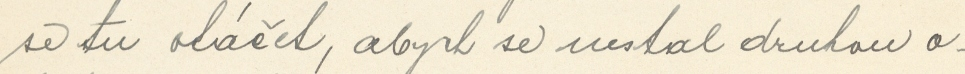se tu otáčet, abych se nestal druhou o-
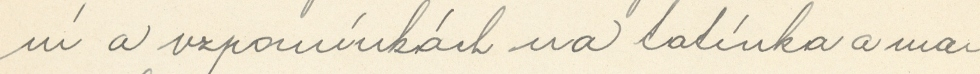ní a vzpomínkách na tatínka a ma-
